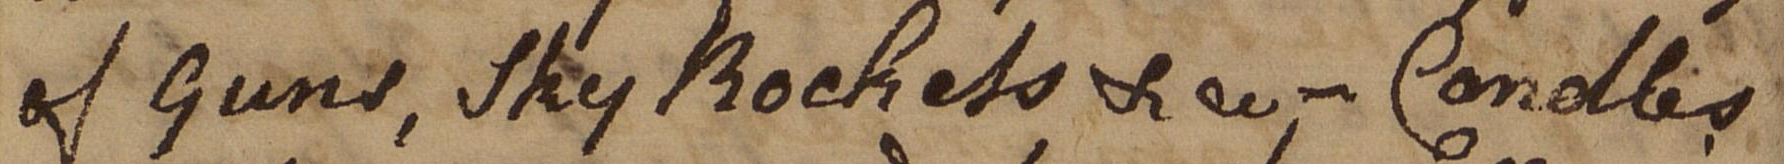of Guns, Sky Rochets &c - Candles
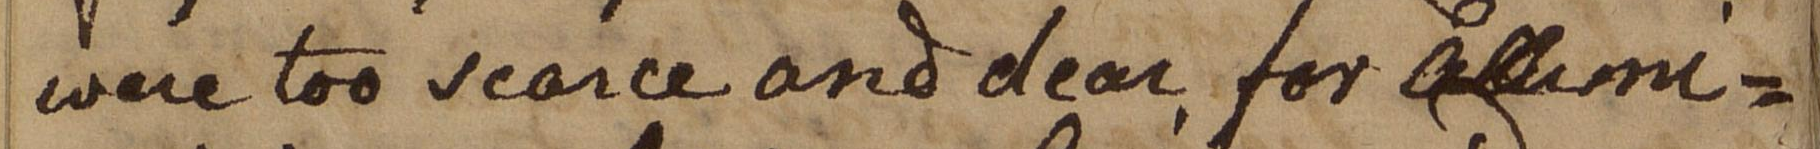were too scarce and dear, for Allumi-
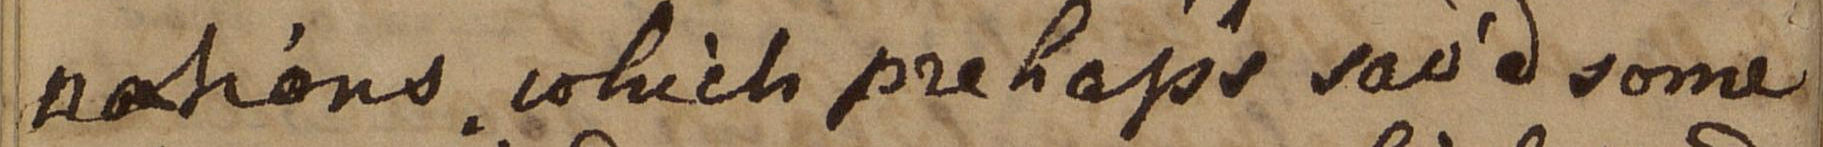nations, which prehaps sav'd some
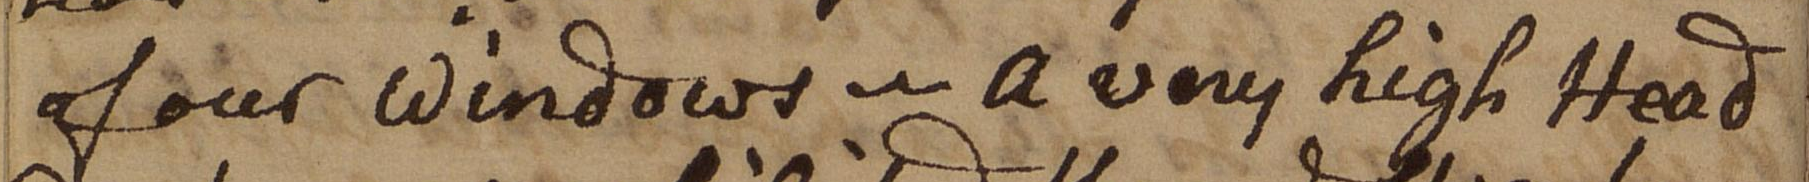of our windows- a very high Head
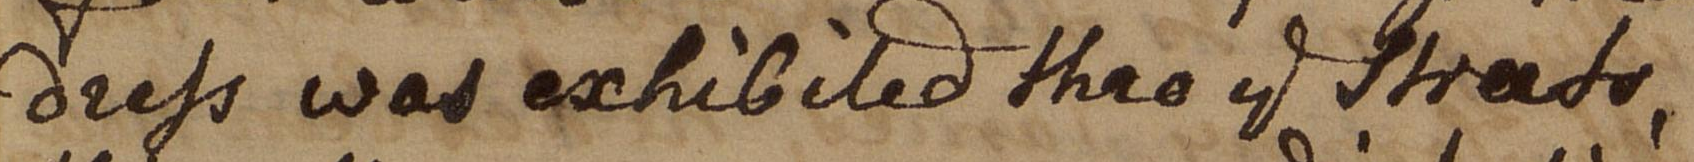dress was exhibiled thro y^e Streets,
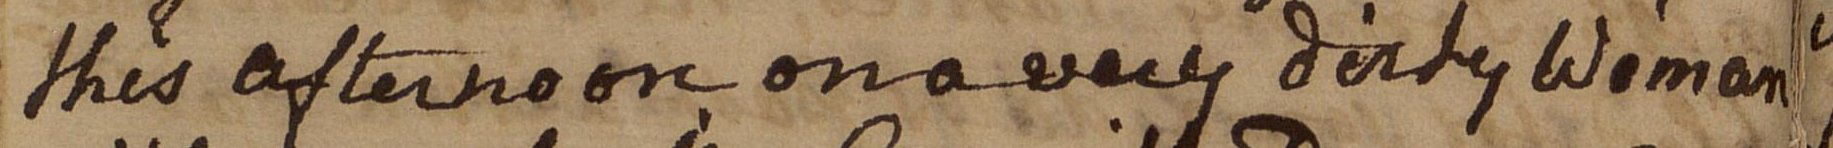this afternoon on a very dirty Woman
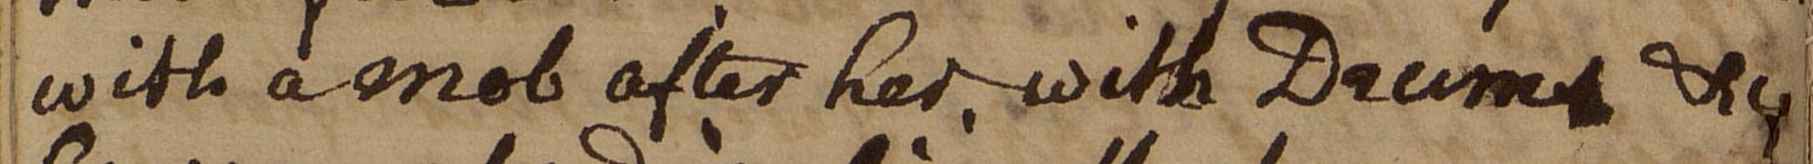with a mob after her, with Drums &c
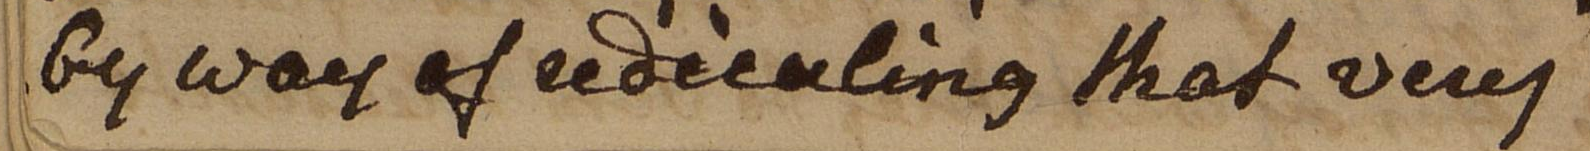by way of ridiculing that very
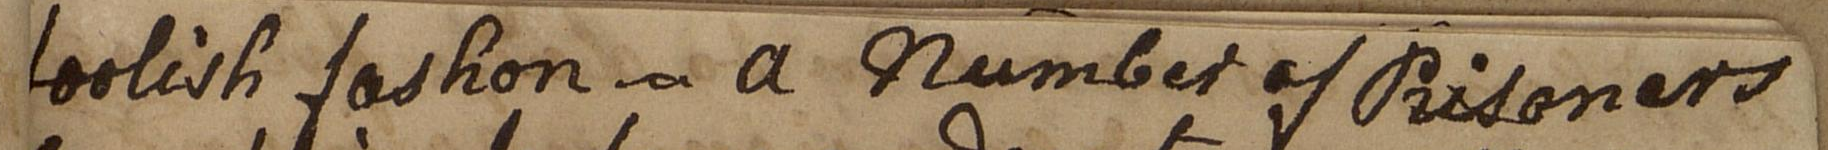foolish fashon- A Number of Prisoners
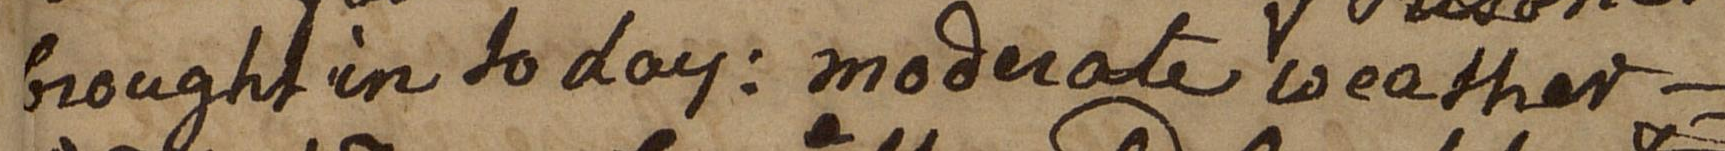brought in to day: moderate weather-
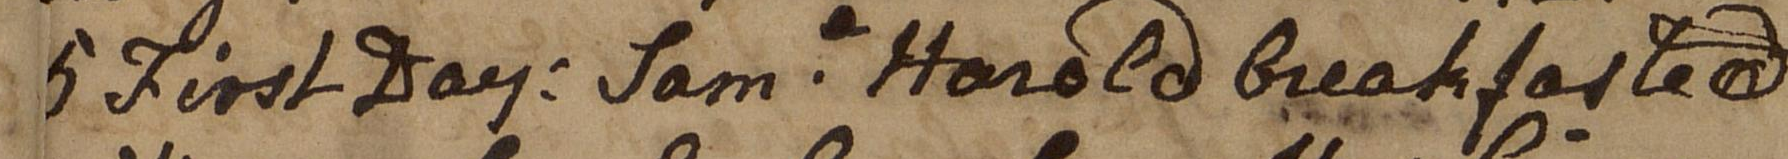5 First Day: Sam^l. Harold breakfasted
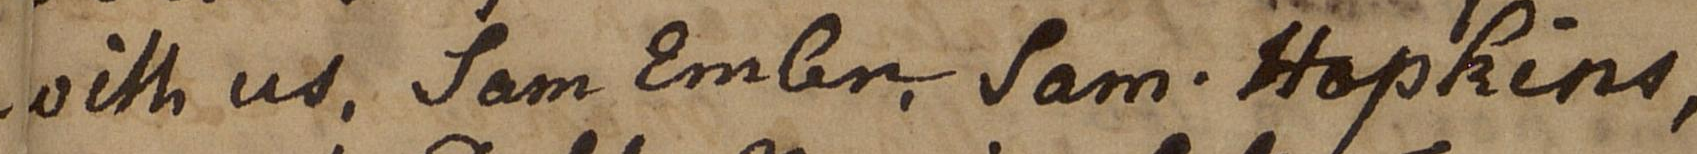with us, Sam Emlen, Sam. Hopkins,
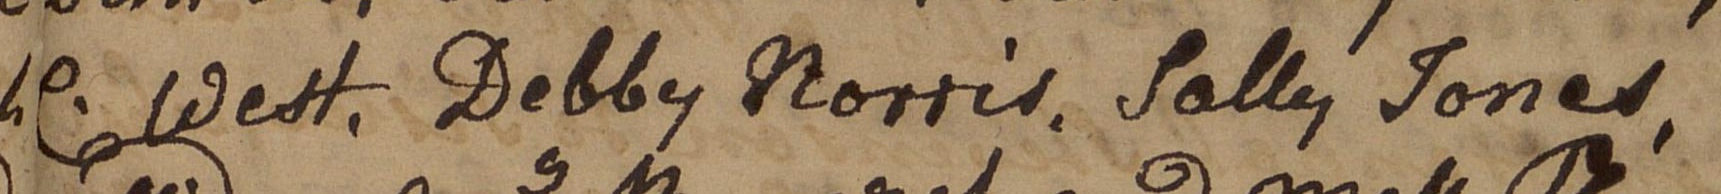C. West, Debby Norris, Sally Jones,
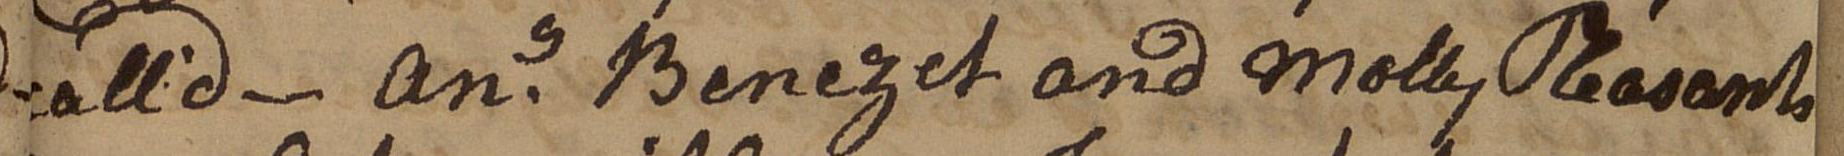call'd- An^y. Benezet and Molly Pleasants
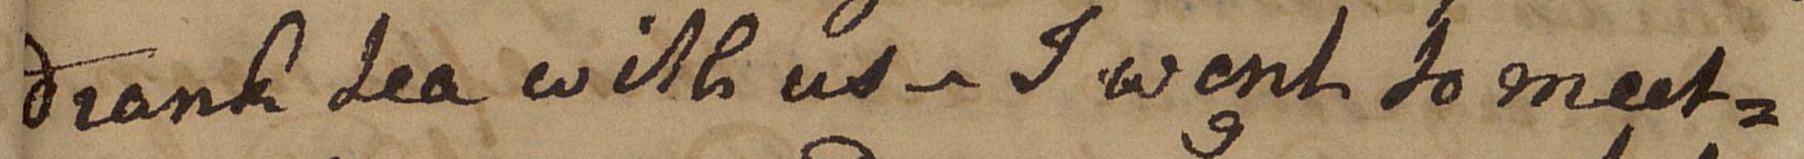drank tea with us- I went to meet-
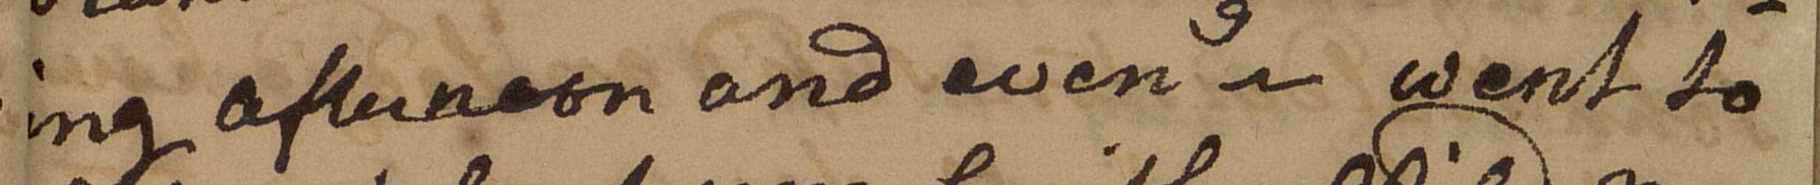ing afternoon and even^g- went to
